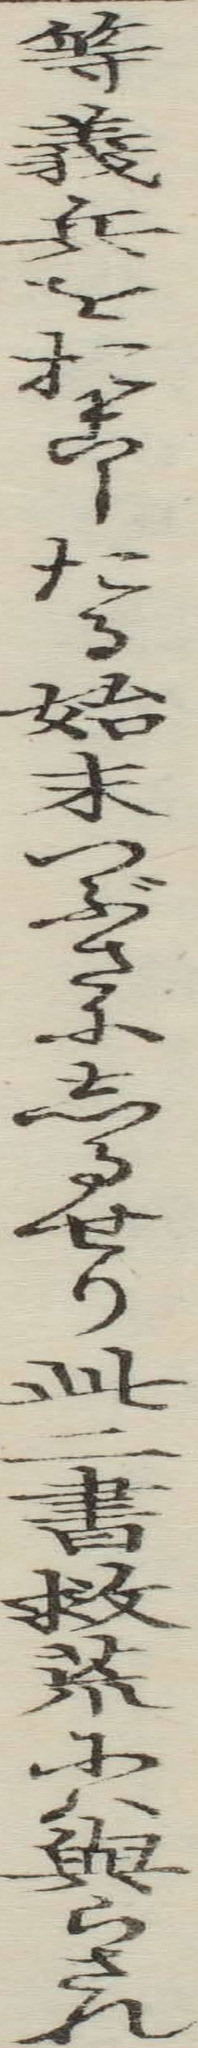等義兵をおこしたる始末つぶさにしるせり此二書救荒には與らされ
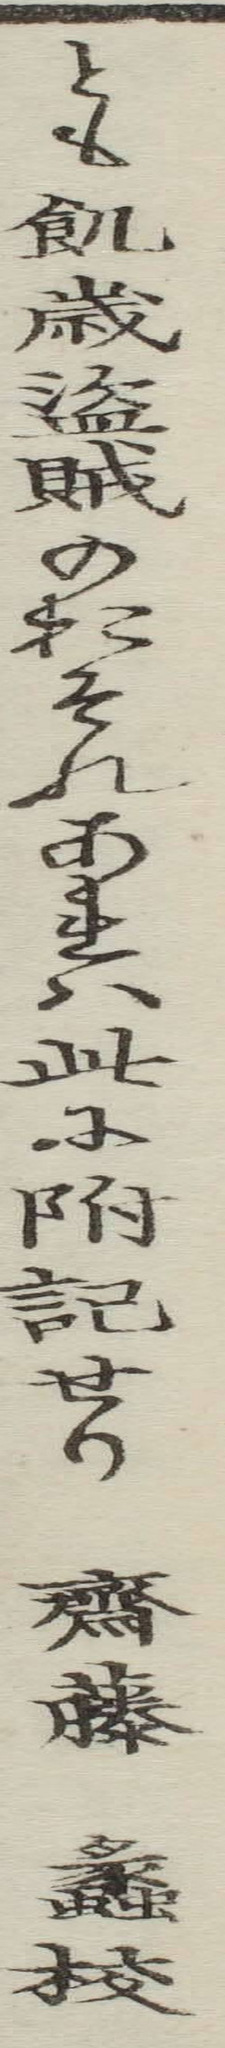とも飢歳盗賊のおそれあれは此に附記せり齋藤蠡校
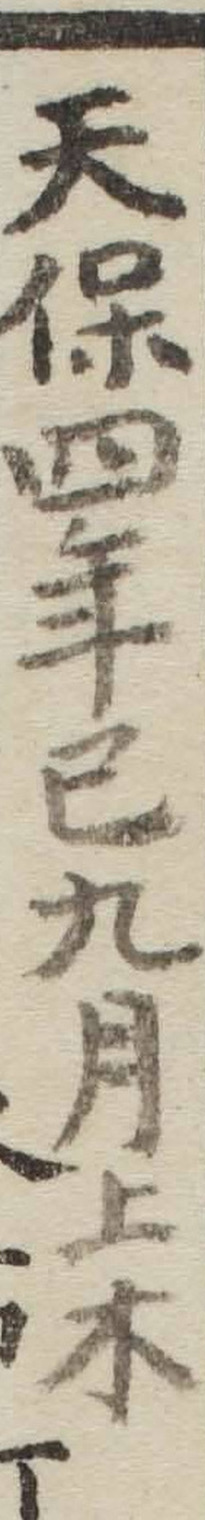天保四年巳九月上木
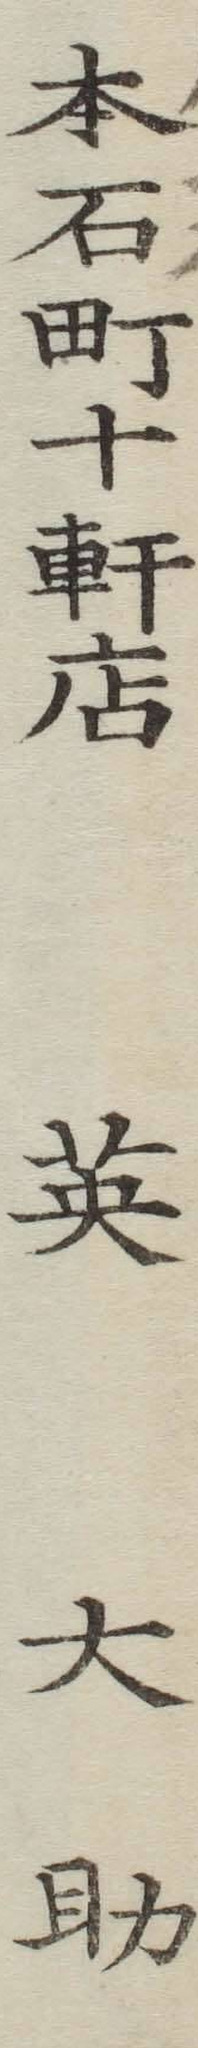本石町十軒店英大助
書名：救荒便覧
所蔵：国文学研究資料館
